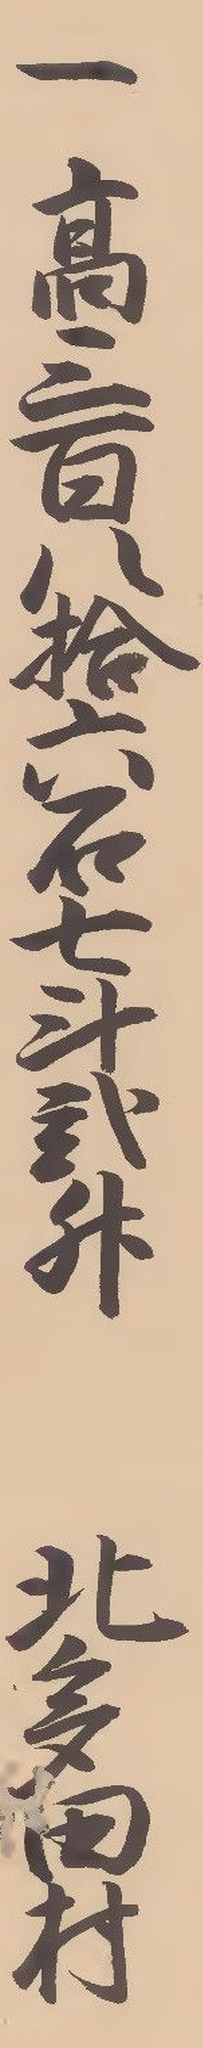一高三百八拾六石七斗弐升北多田村

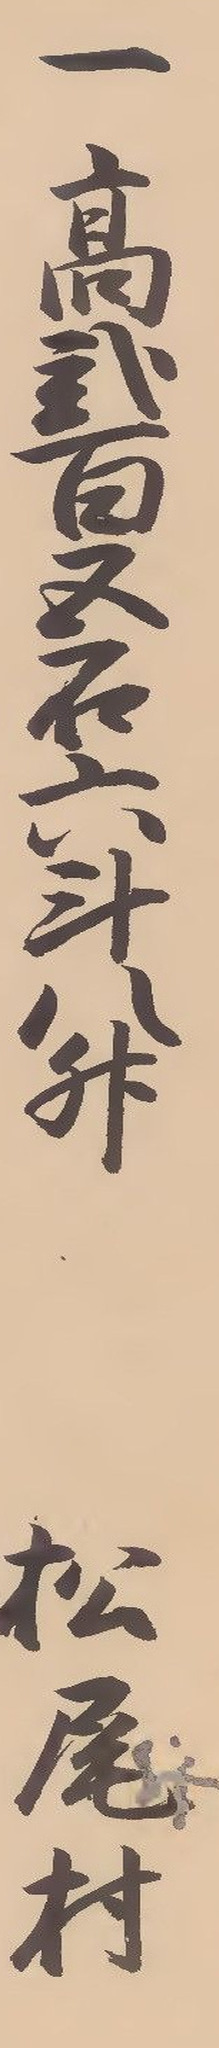一高弐百五石六斗八升松尾村
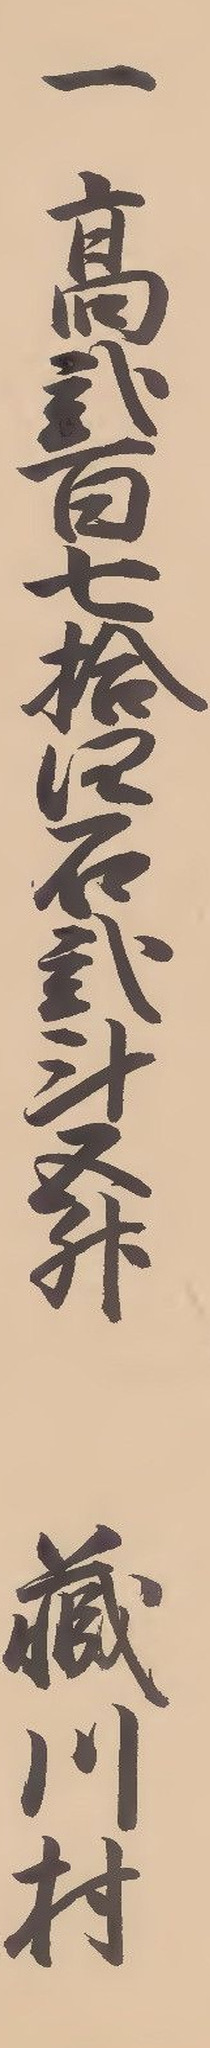一高弐百七拾四石弐斗五升蔵川村
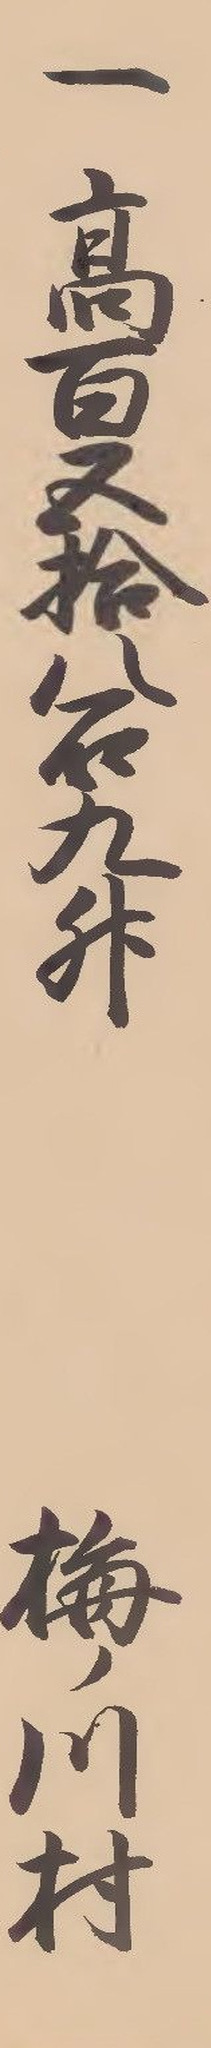一高百五拾八石九升梅ノ川村
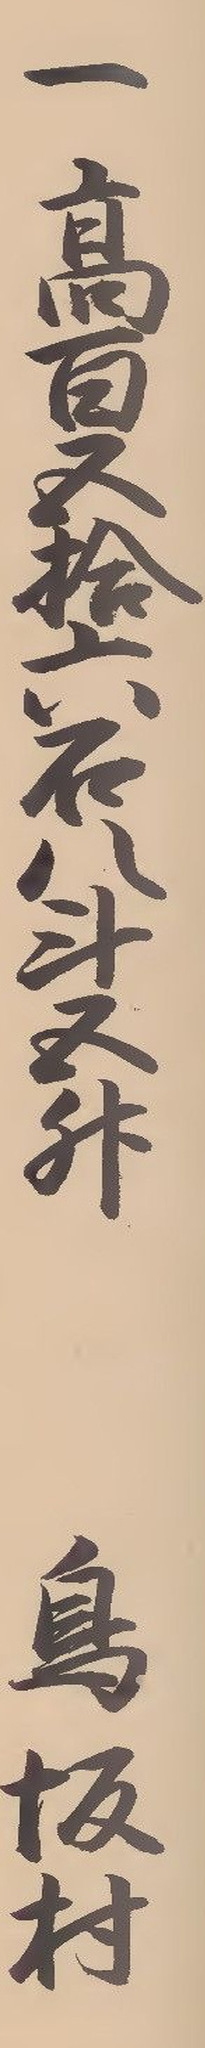一高百五拾六石八斗五升鳥坂村
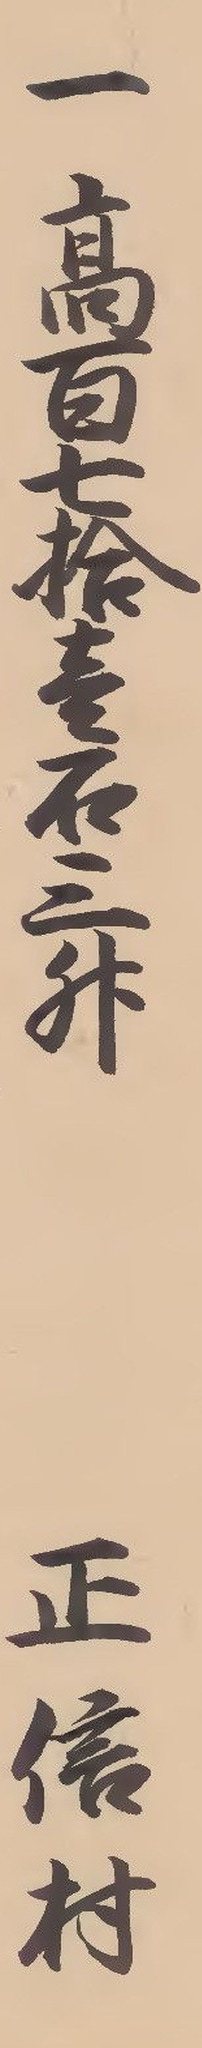一高百七拾壱石三升正信村
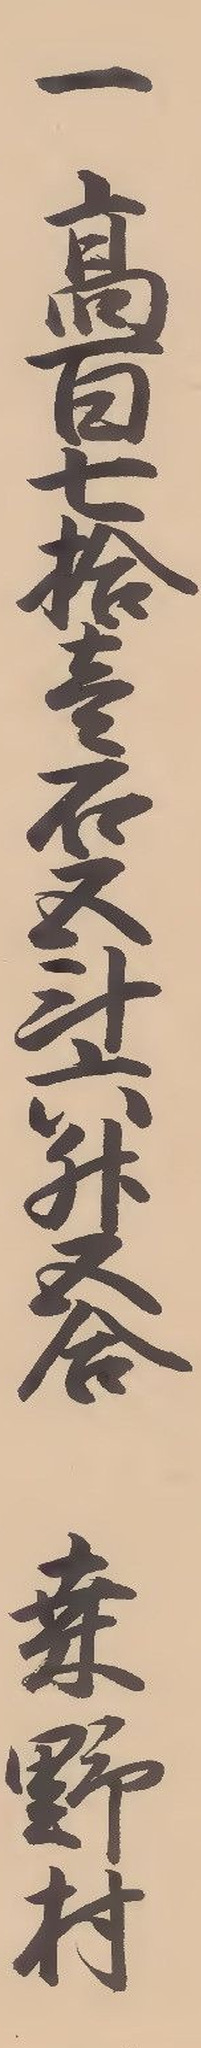一高百七拾壱石五斗六升五合桑野村
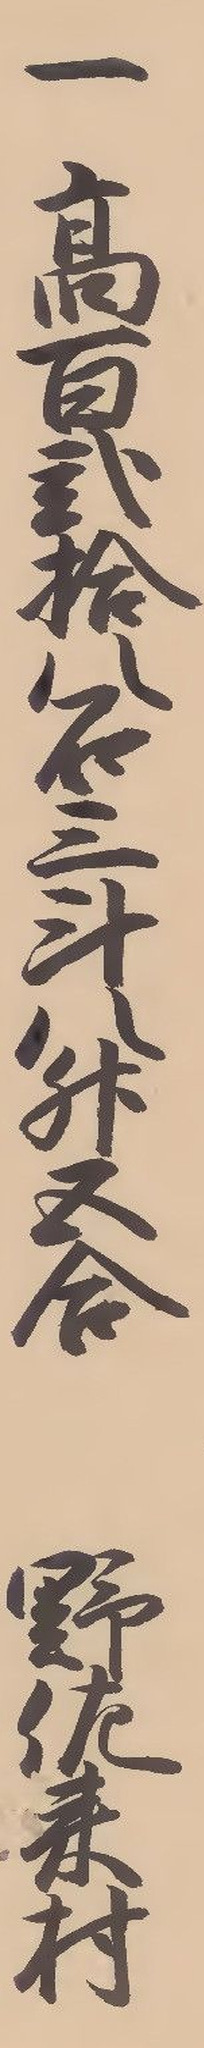一高百弐拾八石三斗八升五合野佐来村

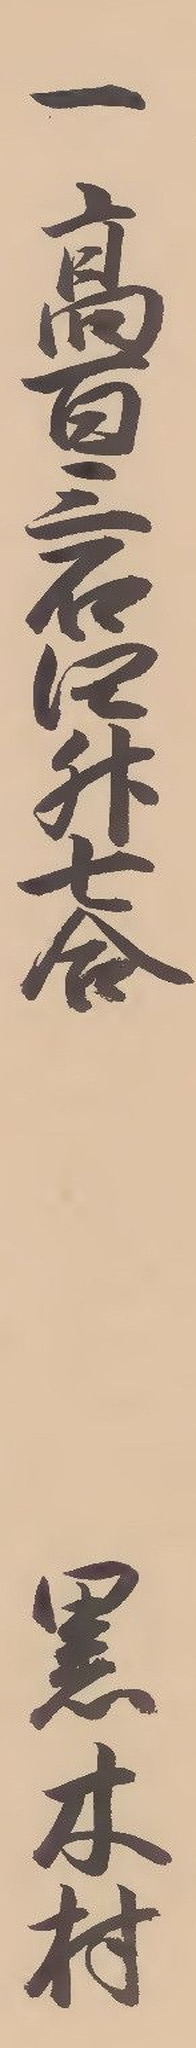一高百三石四升七合黒木村
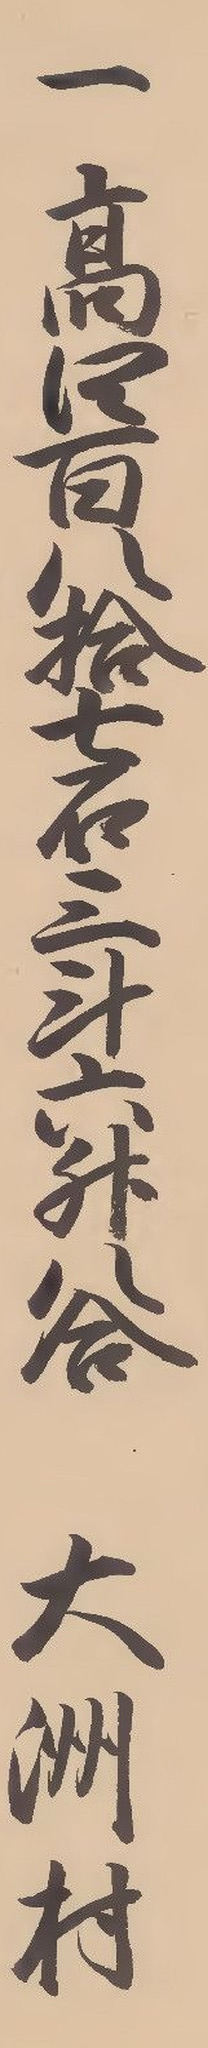一高四百八拾七石三斗六升八合大洲村
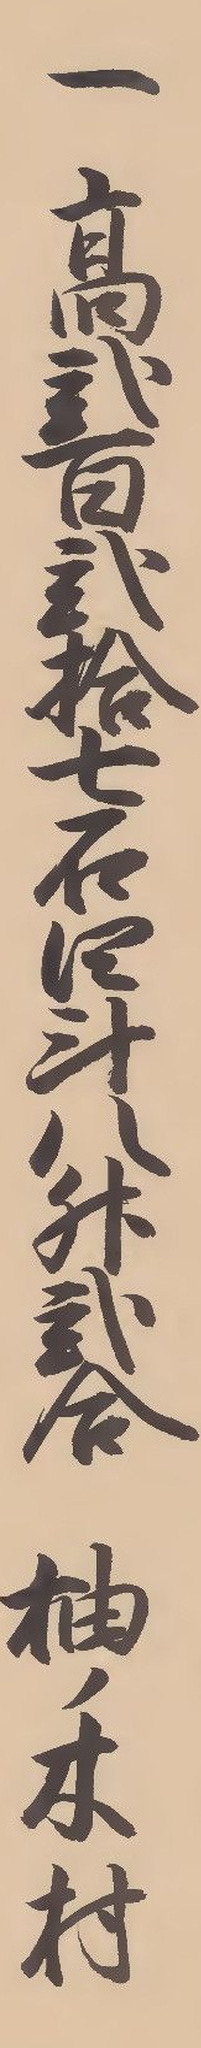一高弐百弐拾七石四斗八升弐合柚ノ木村
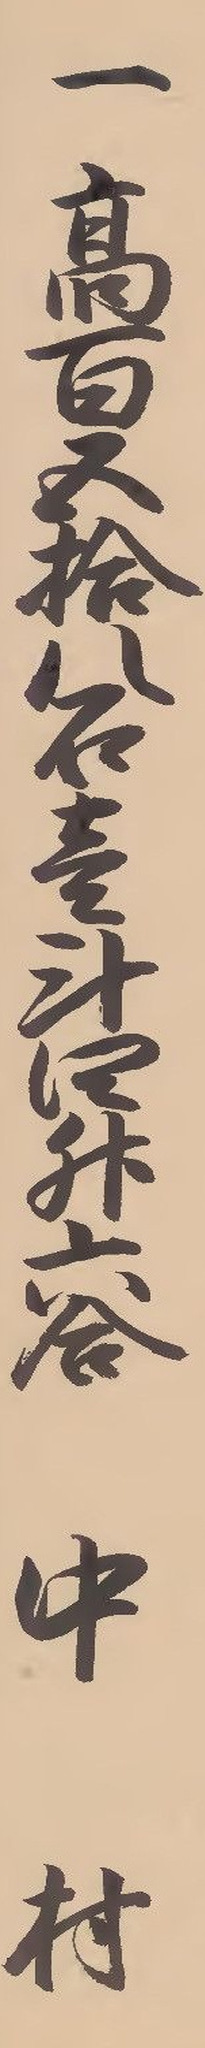一高百五拾八石壱斗四升六合中村
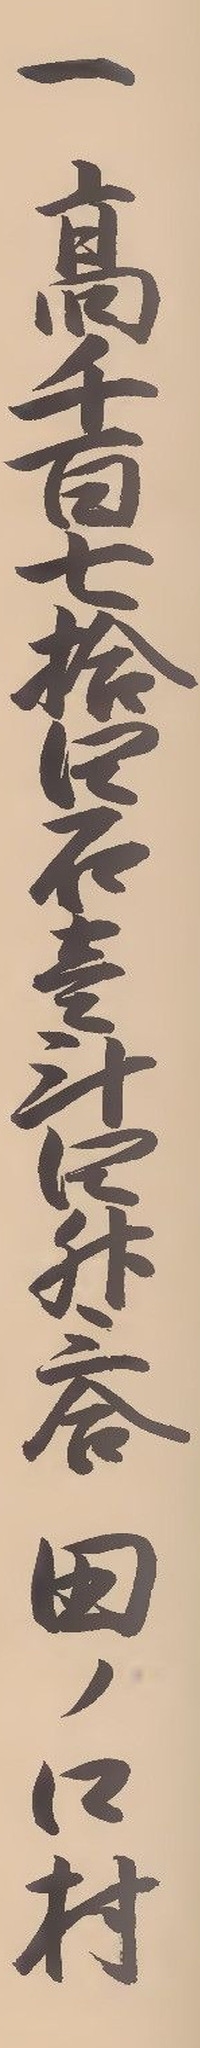一高千百七拾四石壱斗四升三合田ノ口村
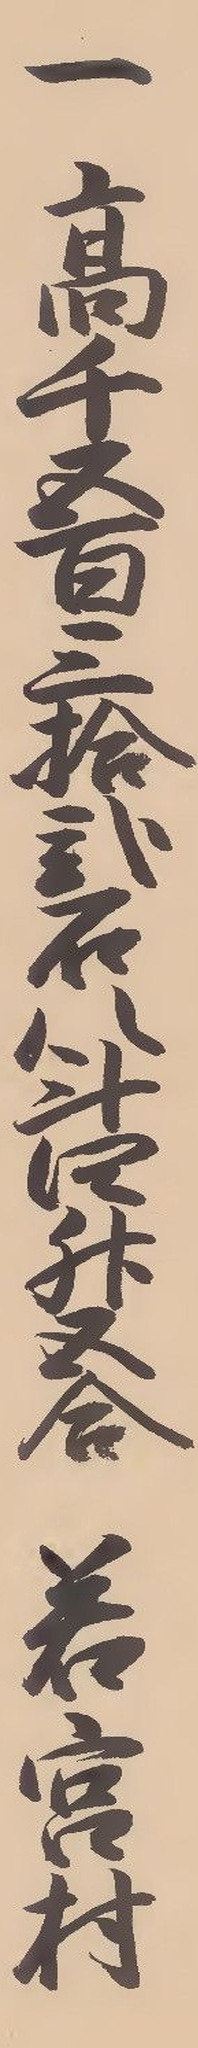一高千五百三拾弐石八斗四升五合若宮村
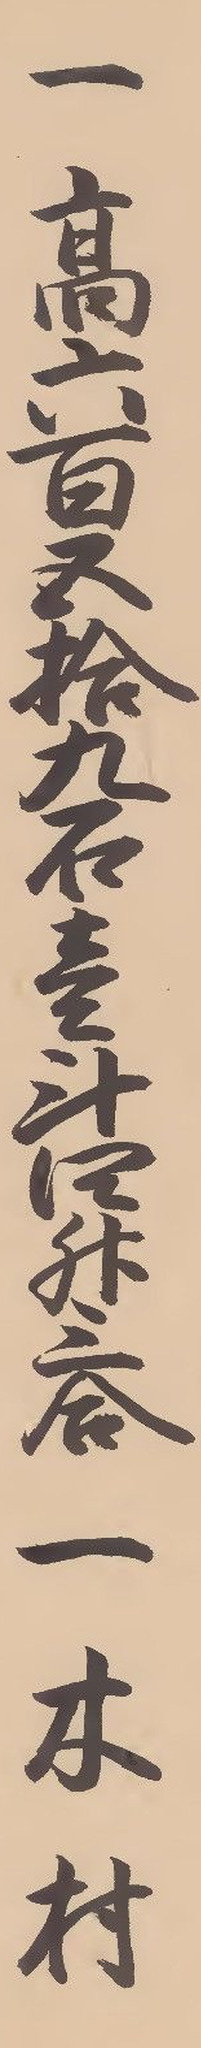一高六百五拾九石壱斗四升三合一木村
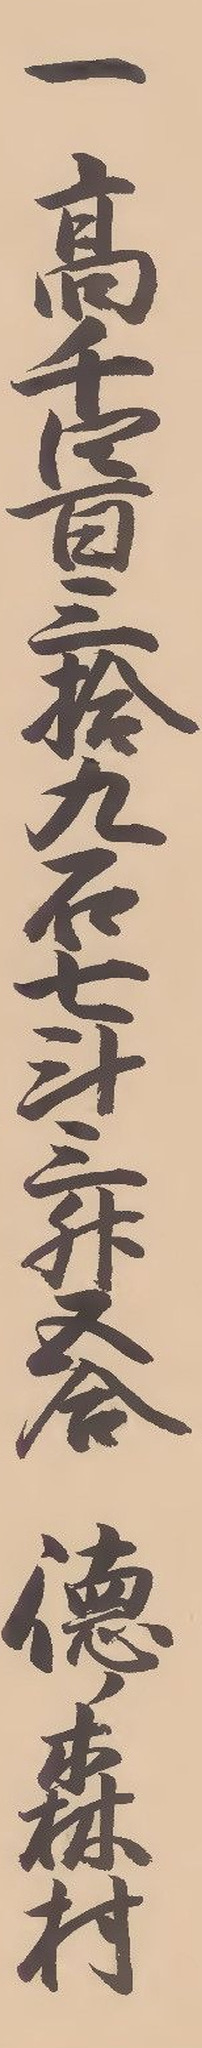一高千四百三拾九石七斗三升五合徳ノ森村
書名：伊予国郷帳
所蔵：国立公文書館 National Archives of Japan
